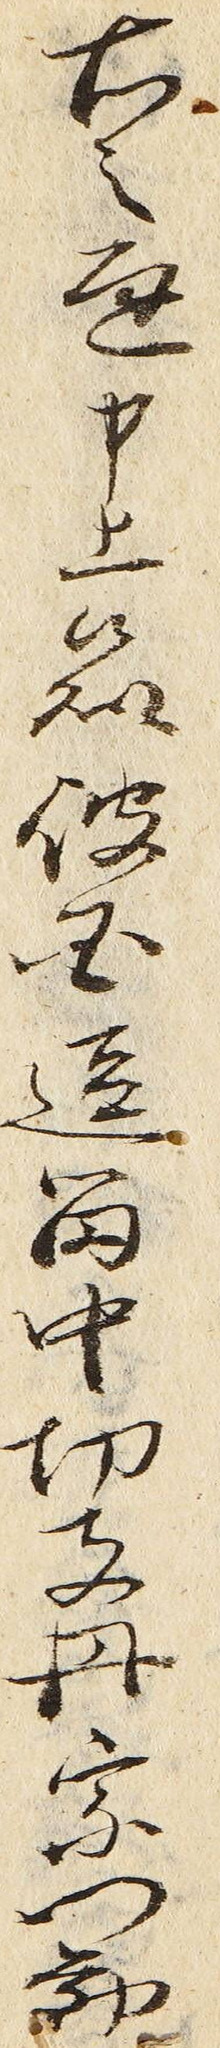右之通申上候処彼国逗留中切支丹宗門勧
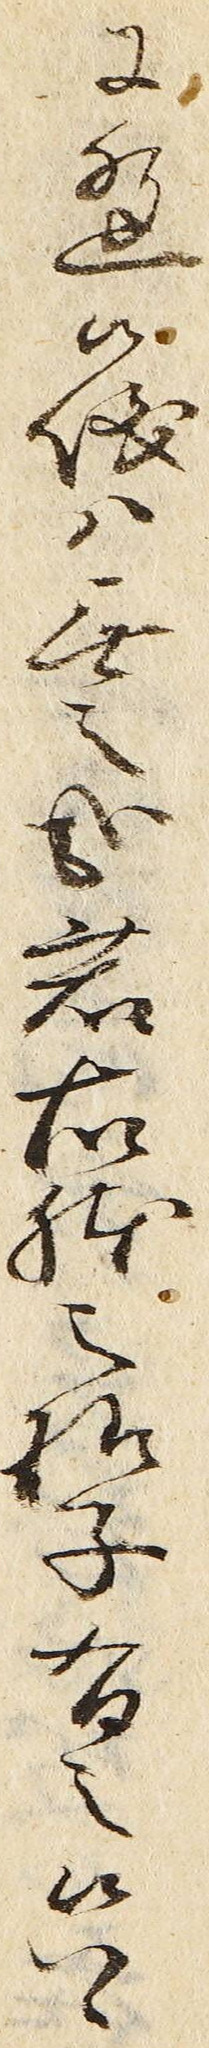に逢候儀は無之哉若右体之様子有之候はゝ
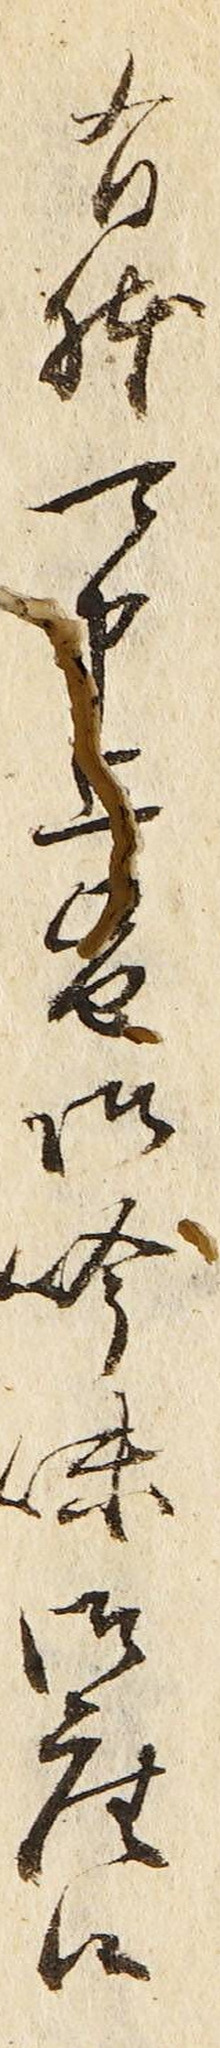有体可申上旨御吟味御座候
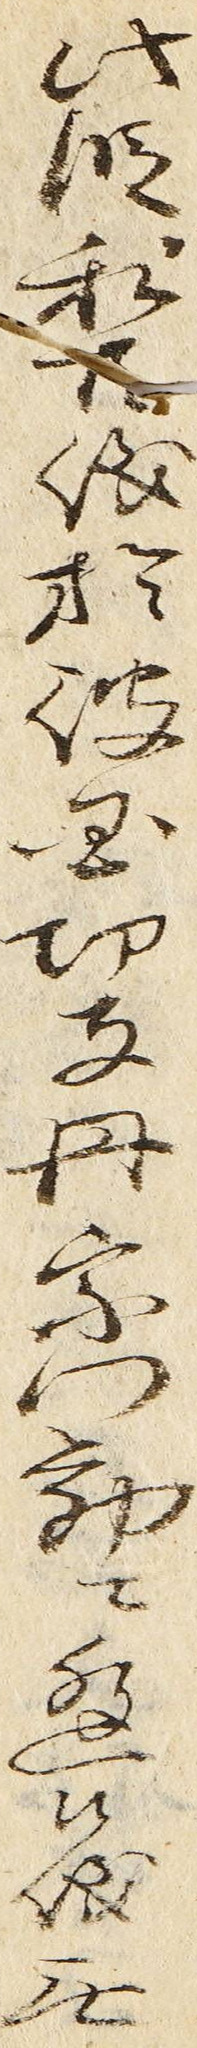此段は私共儀於彼国切支丹宗門勧に逢候儀無
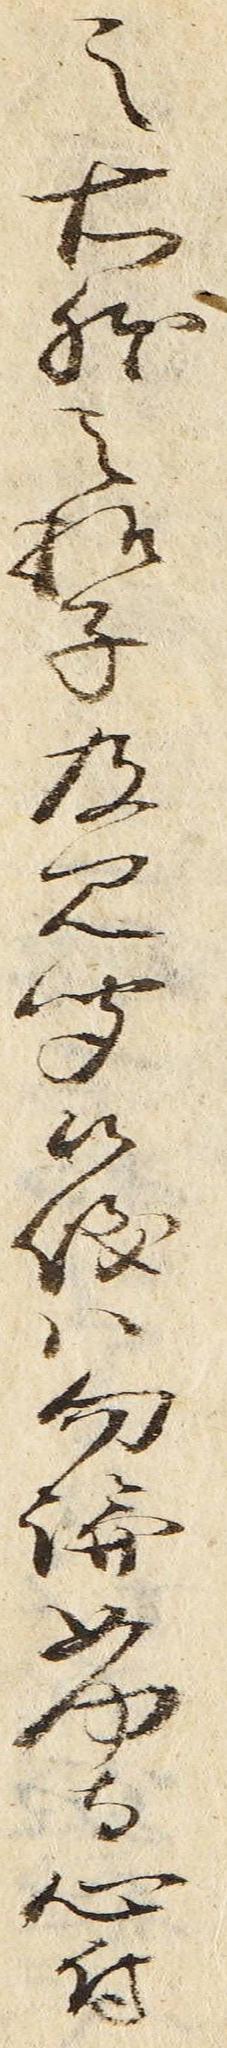之右体之様子及見聞候儀は勿論如何と心付
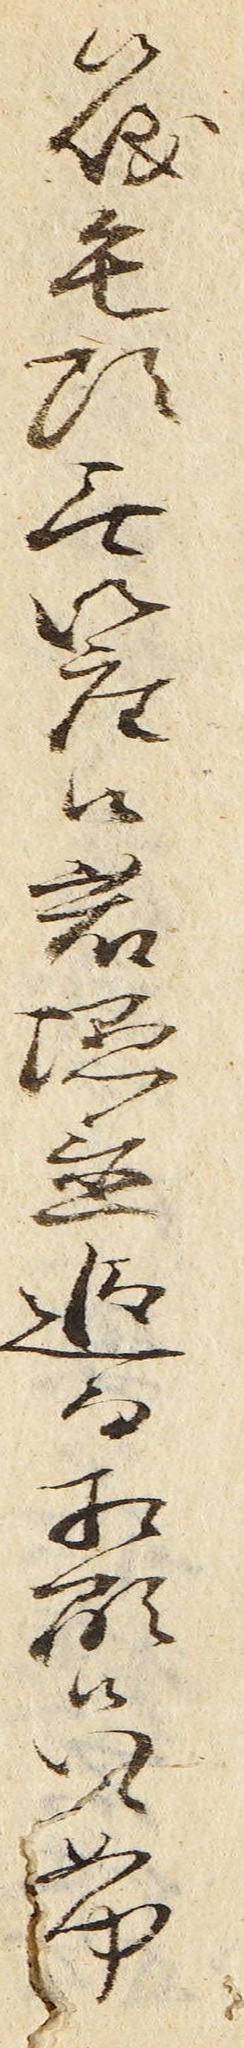候儀毛頭無御座候若隠置追て相顕候はゝ如何
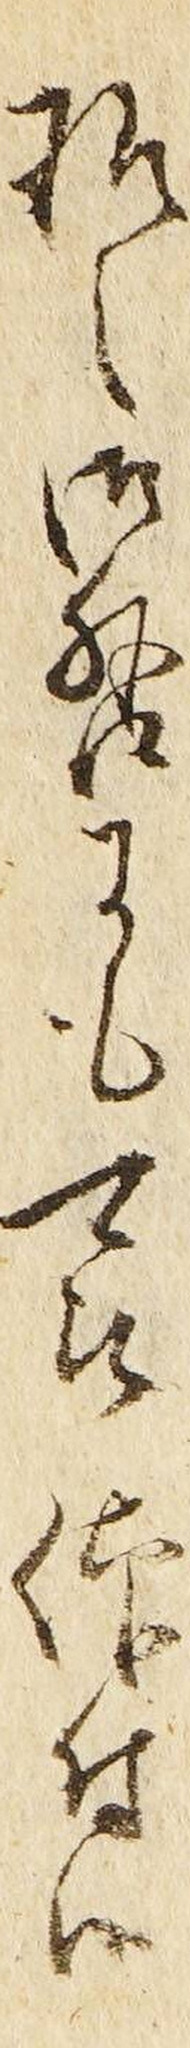様之御咎にも可被仰付候
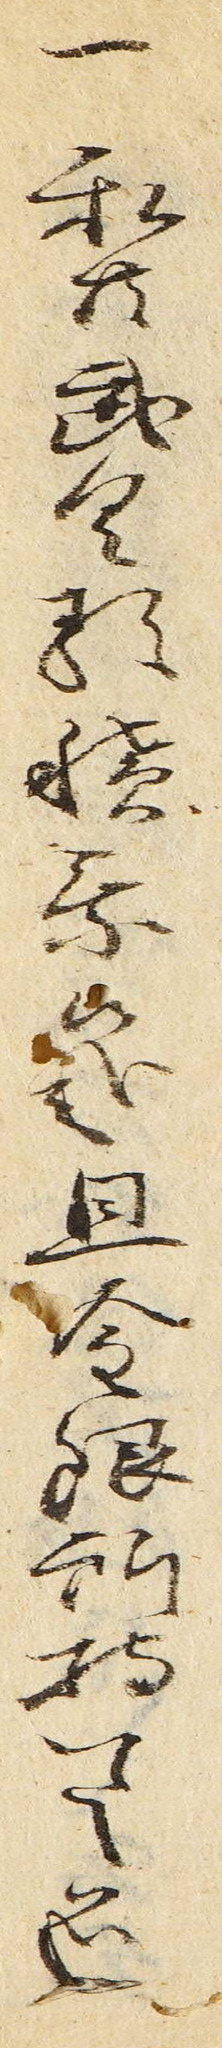一私共武具類積乗候哉且金銀所持いたし候哉

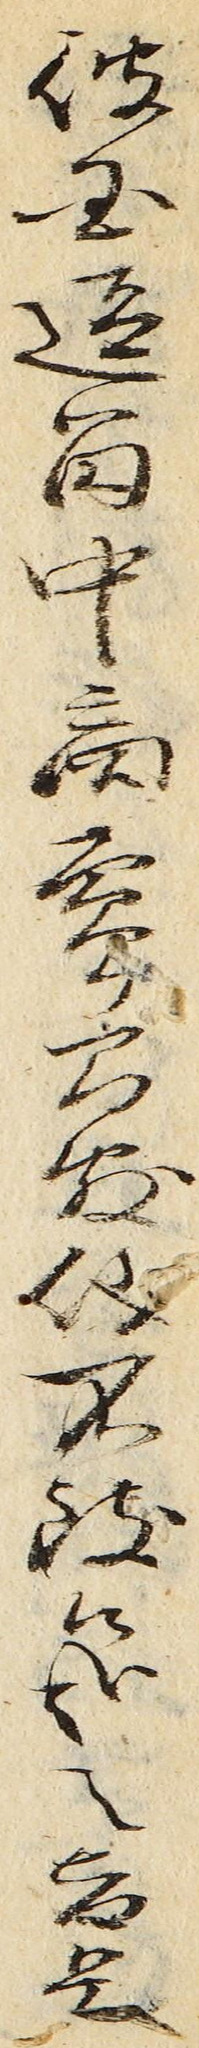彼国逗留中商売ヶ間敷儀不致候哉之旨是
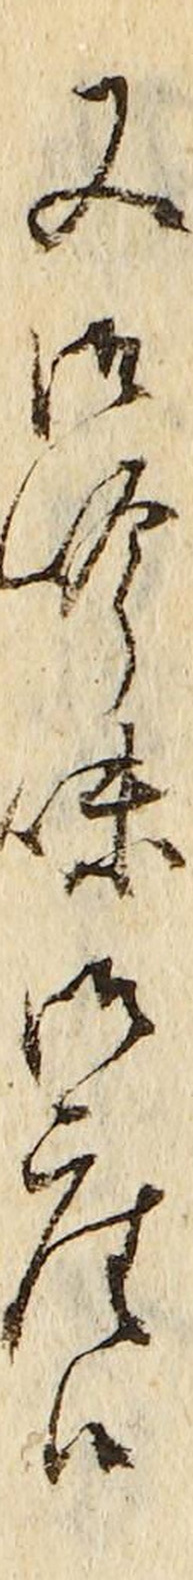又御吟味御座候
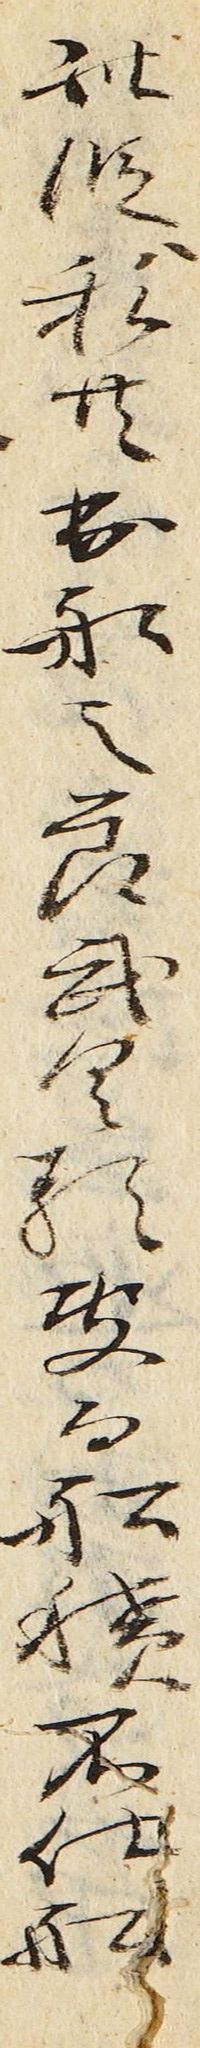此段は私共出船之節武具類決て船積不仕船
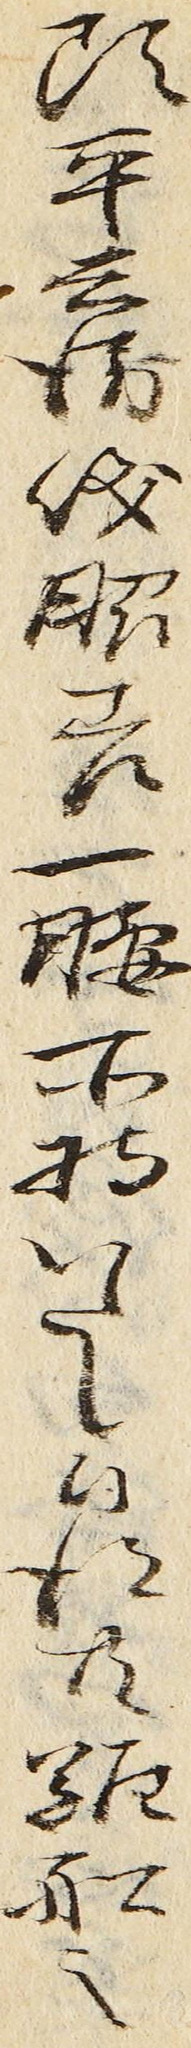頭平兵衛儀脇差一腰所持いたし候得共難船之
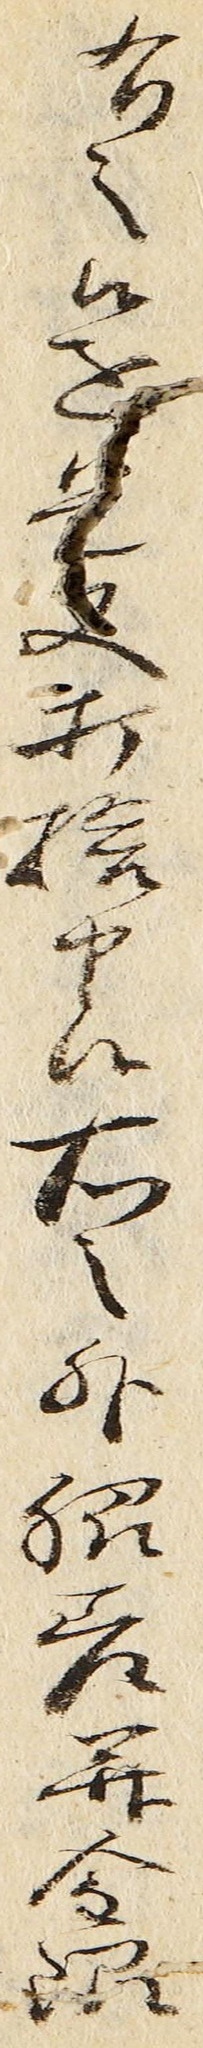有之候を是又打捨申候右之外脇差并金銀
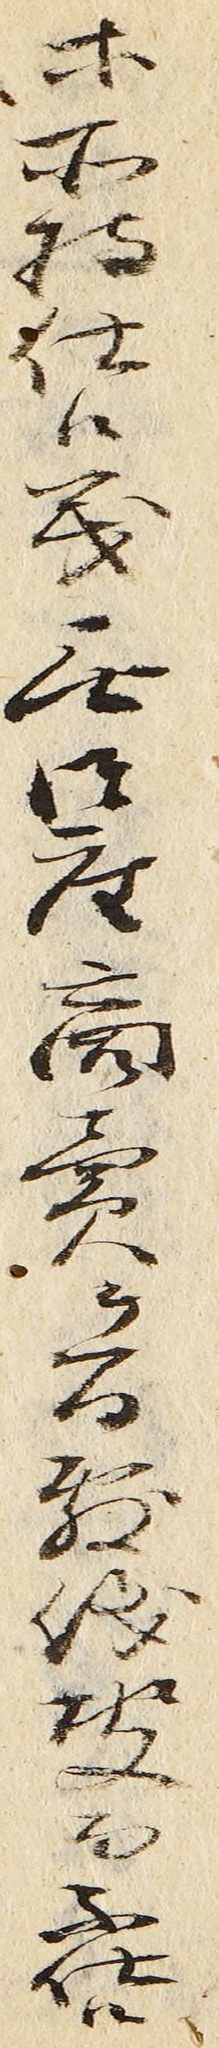等所持仕候義無御座商売ヶ間敷儀決て不仕候
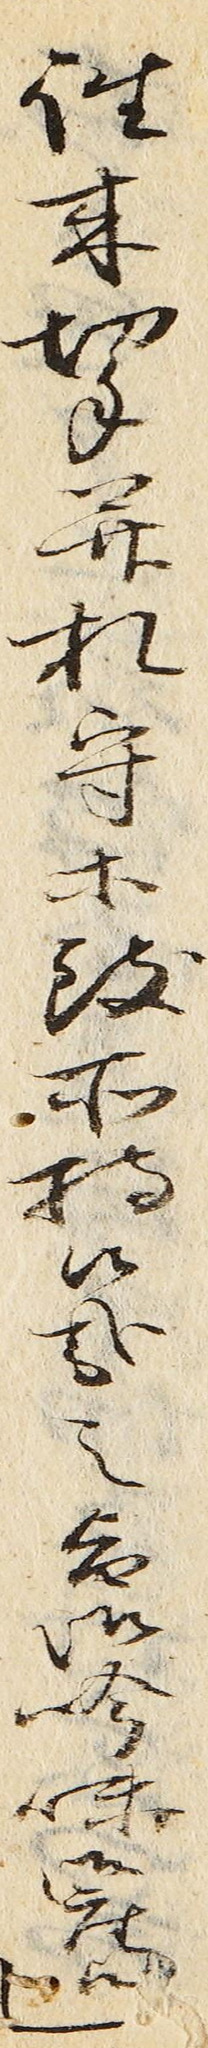一往来切手并札守等致所持候哉之旨御吟味御座候」
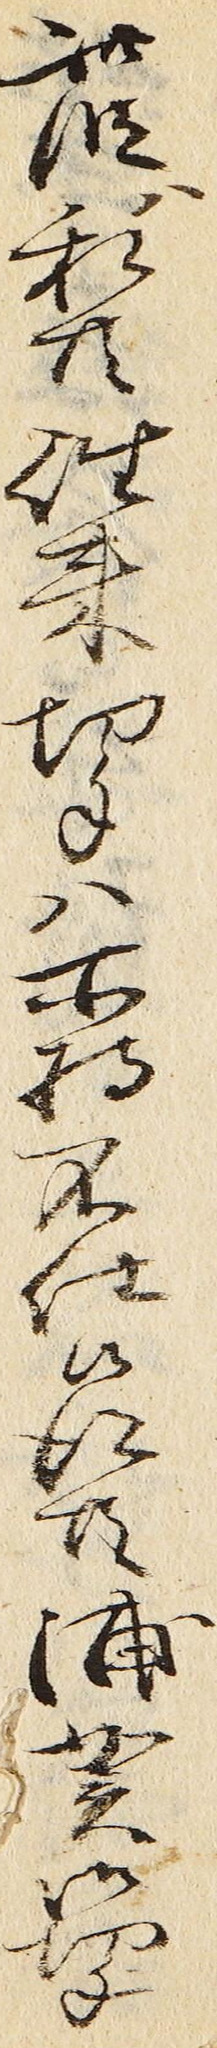此段は私共往来切手は所持不仕候得共浦賀御切手
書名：漂民後記
